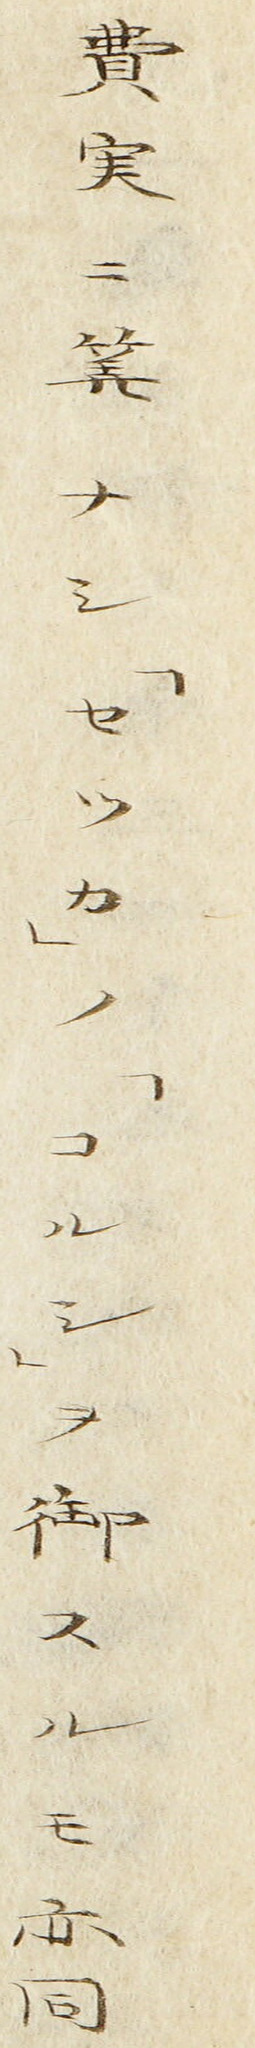費実ニ筭ナシ「セツカ」ノ「コルシ」ヲ御スルモ亦同
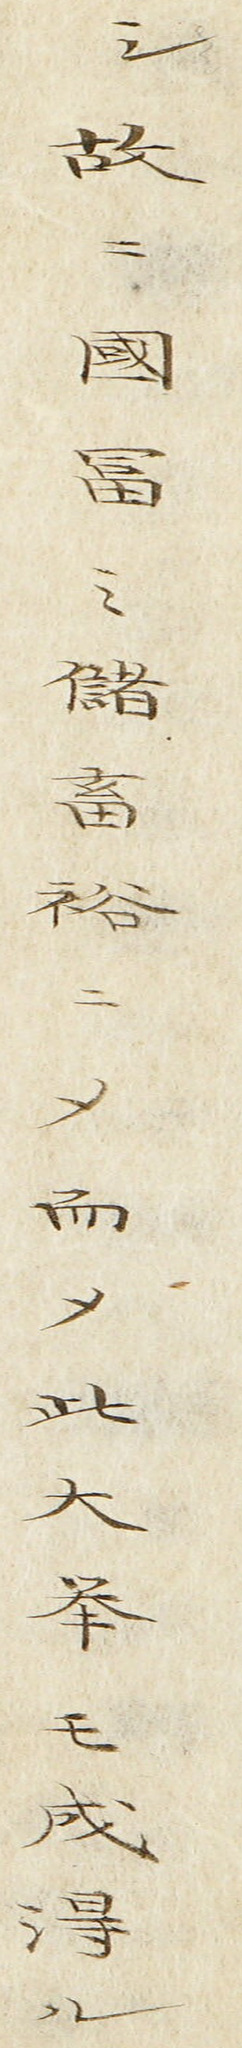シ故ニ國富ミ儲畜裕ニシテ而シテ此大挙モ成得ル
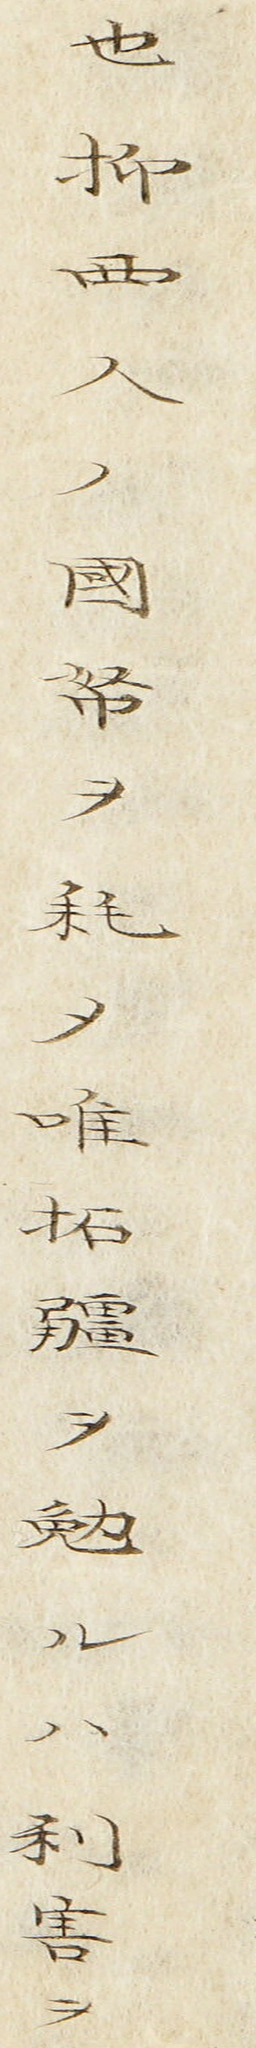也抑西人ノ國帑ヲ耗シテ唯拓疆ヲ勉ルハ利害ヲ
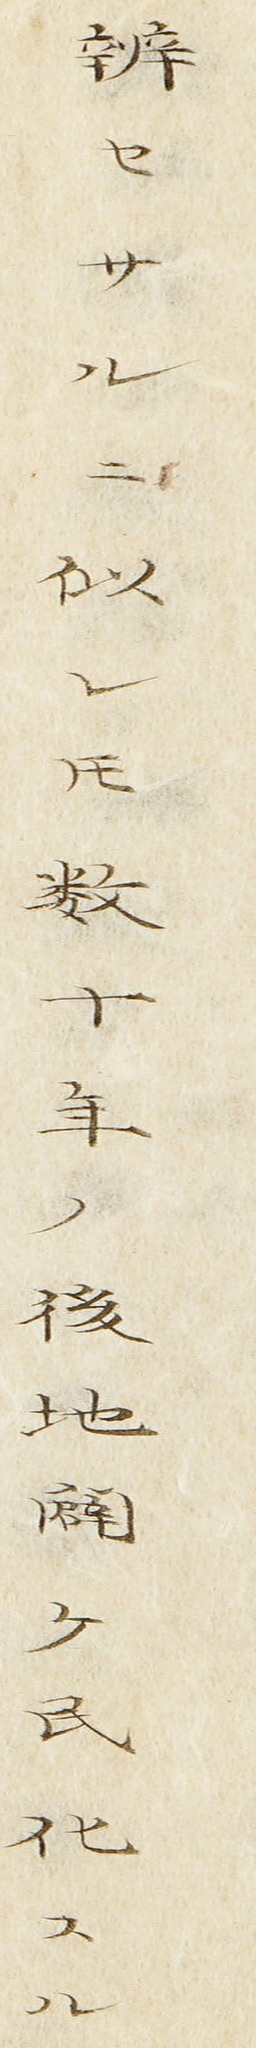辨セサルニ似レトモ数十年ノ後地闢ケ民化スル
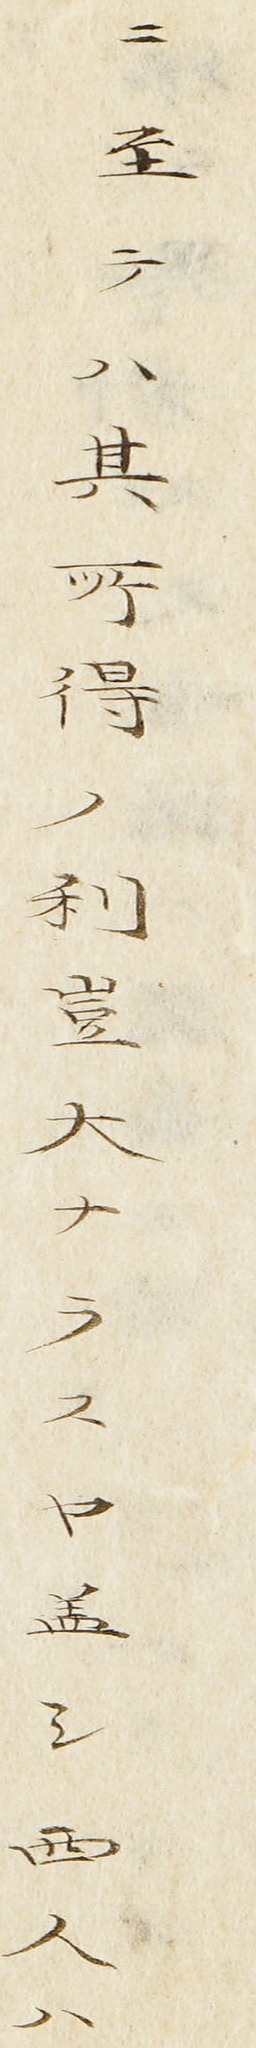ニ至テハ其所得ノ利豈大ナラスヤ盖シ西人ハ
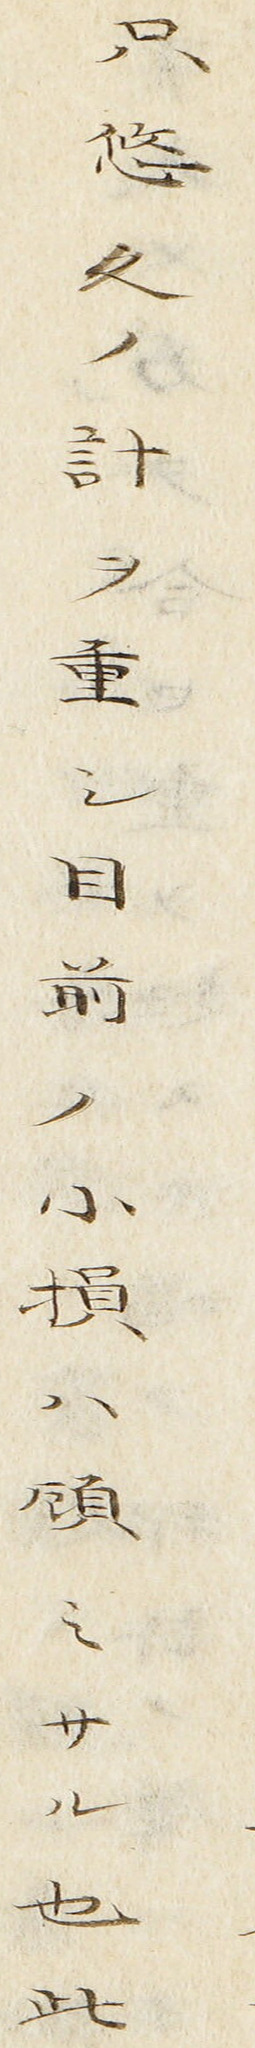只悠久ノ計ヲ重シ目前ノ小損ハ顧ミサル也此
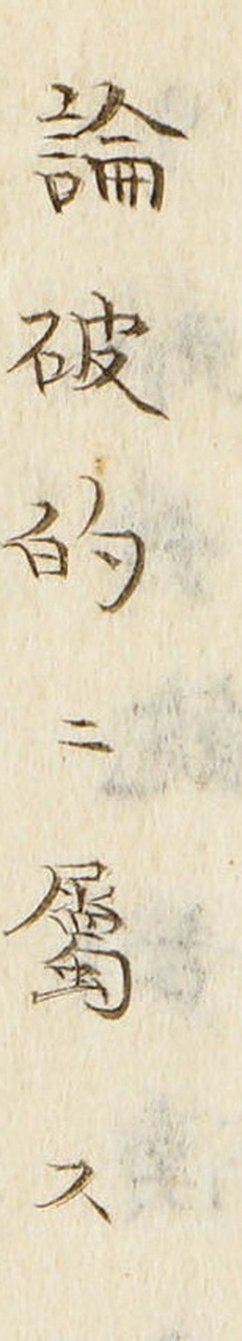論破的ニ屬ス
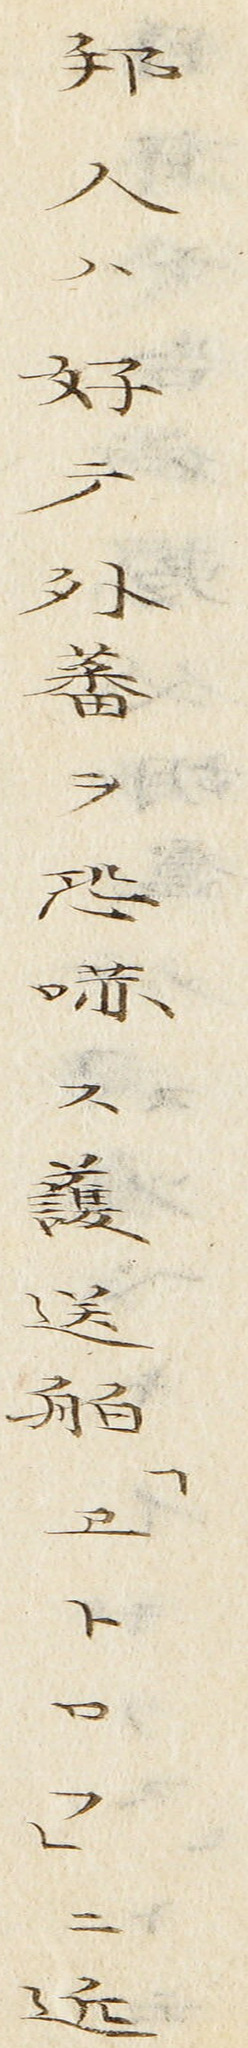〇邦人ハ好テ外蕃ヲ恐ス護送舶「ヱトロフ」ニ近
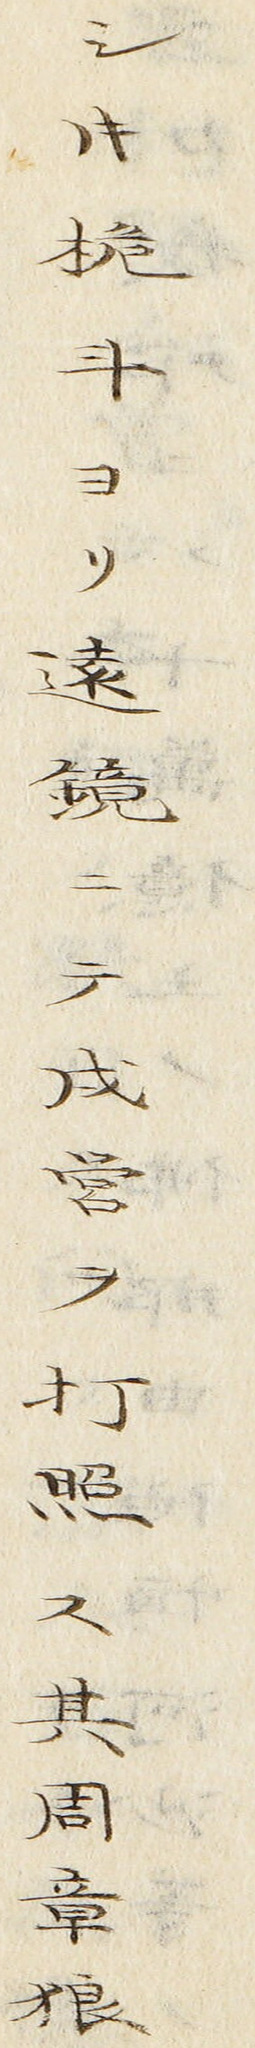シトキ桅斗ヨリ遠鏡ニテ戍営ヲ打照ス其周章狼
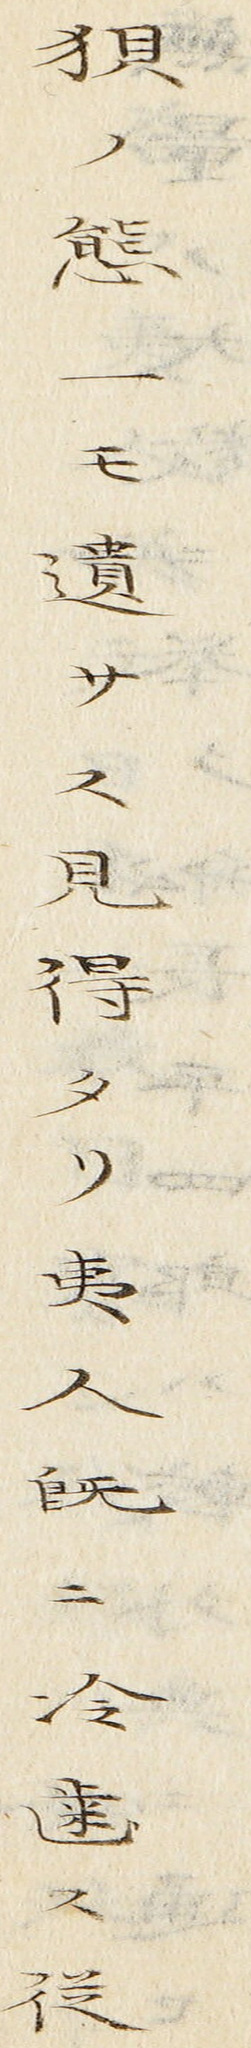狽ノ態一モ遺サス見得タリ夷人既ニ冷歯ス従
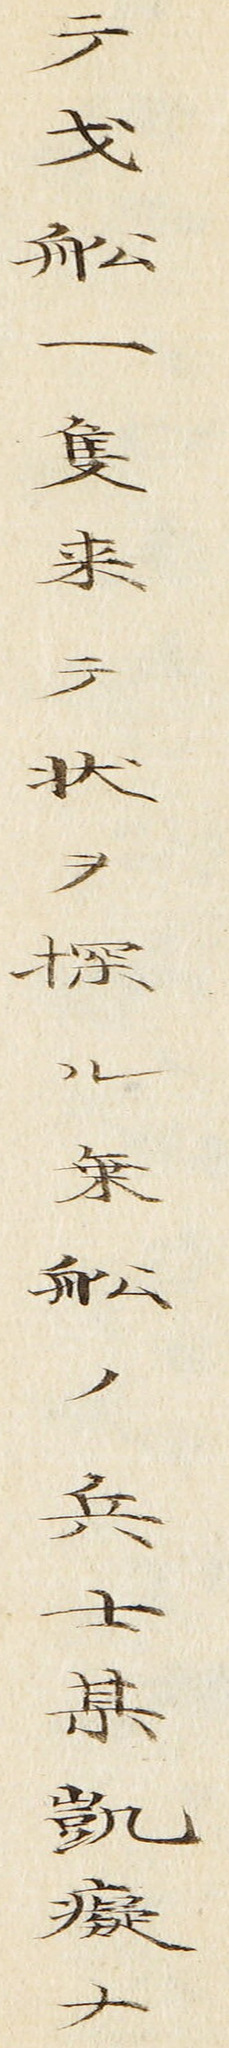テ戈舩一隻来テ状ヲ探ル乗舩ノ兵士某凱癡ナ
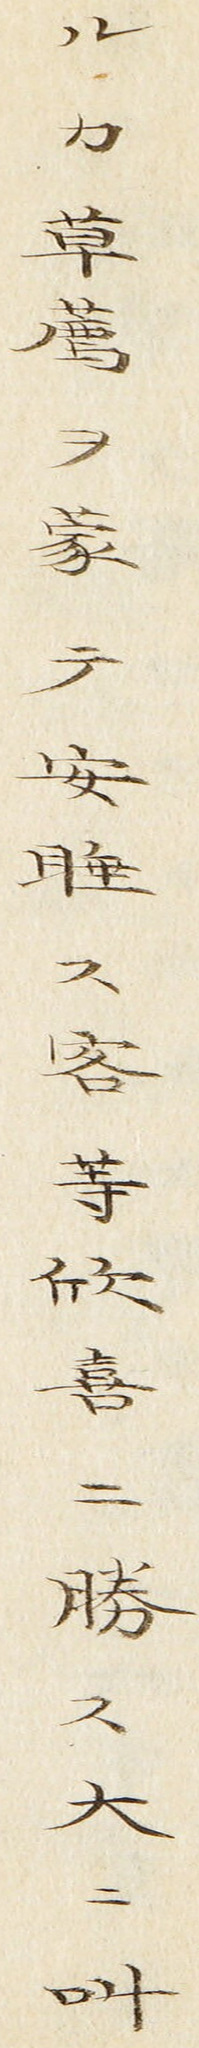ルカ草薦ヲ蒙テ安睡ス客等欣喜ニ勝ス大ニ叫
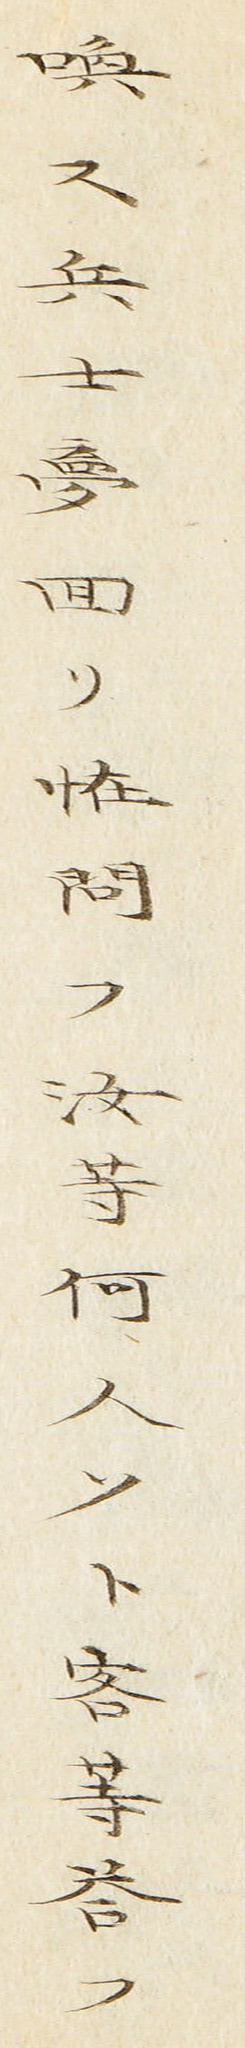喚ス兵士夢回リ恠問フ汝等何人ソト客等答フ
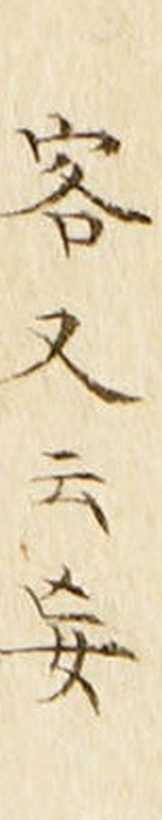客又云妄
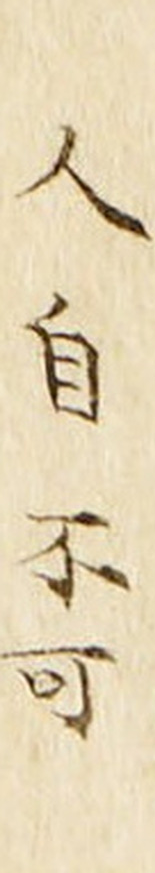人自不可
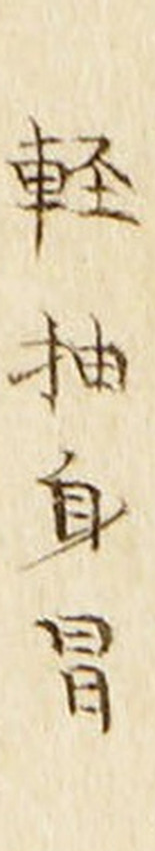軽抽身冒
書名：蕃談
